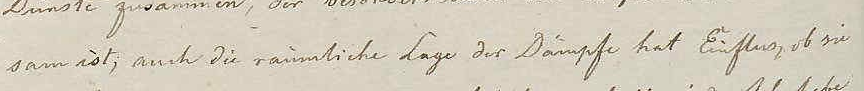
sam ist, auch die räumliche Lage der Dämpfe hat Einflus, ob sie
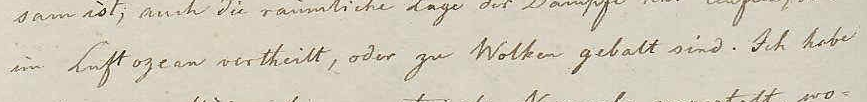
im Luftozean vertheilt, oder zu Wolken gebalt sind. Ich habe
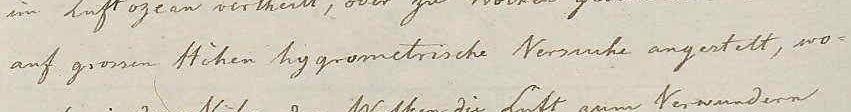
auf grossen Höhen hygrometrische Versuche angestelt, wo-
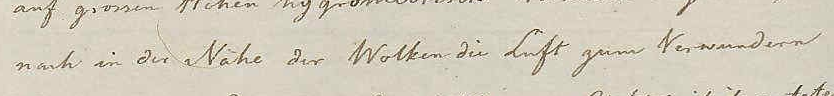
nach in der Nähe der Wolken die Luft zum Verwundern
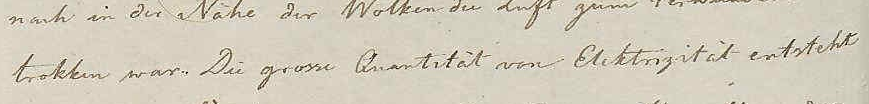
trokken war. Die grosse Quantität von Elektrizität entsteht
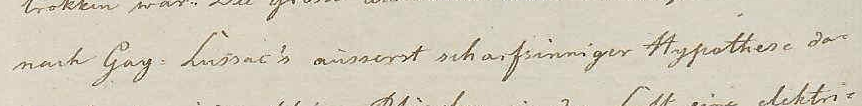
nach Gay Lussac's äusserst scharfsinniger Hypothese da-
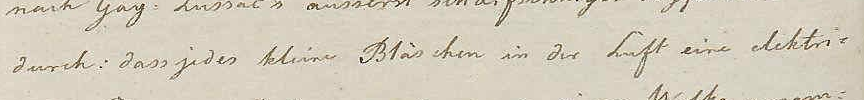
durch: dass jedes kleine Bläschen in der Luft eine elektri-
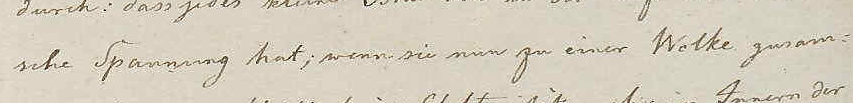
sche Spannung hat; wenn sie nun zu einer Wolke zusam-
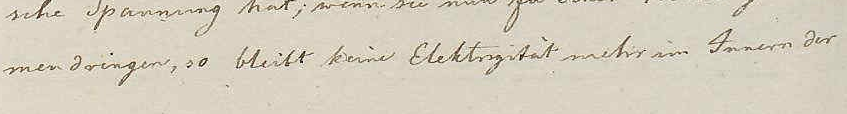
men dringen, so bleibt keine Elektrizität mehr im Innern der
